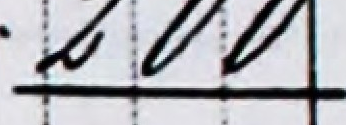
200
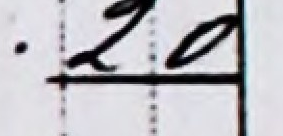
20
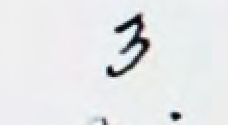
3
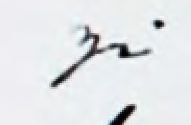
zu
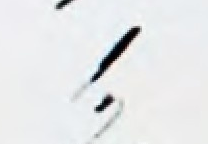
1
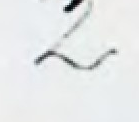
2
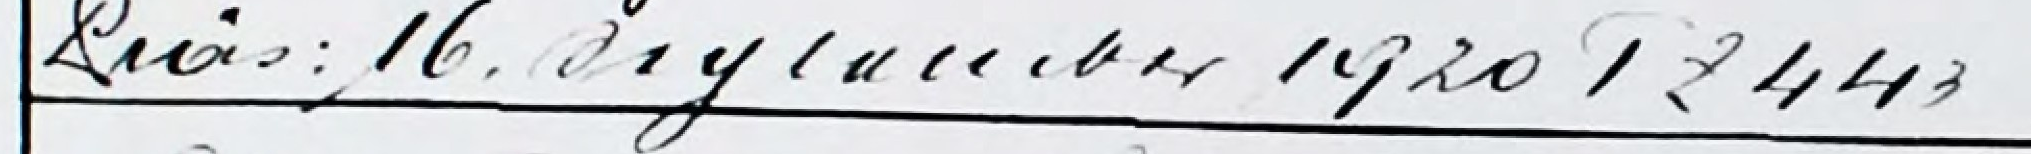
Präs: 16. September 1920 T Z 443
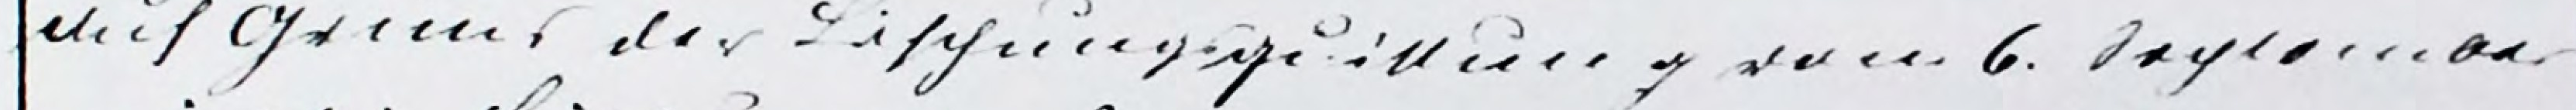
Auf Grund der Löschungsquittung vom 6. September
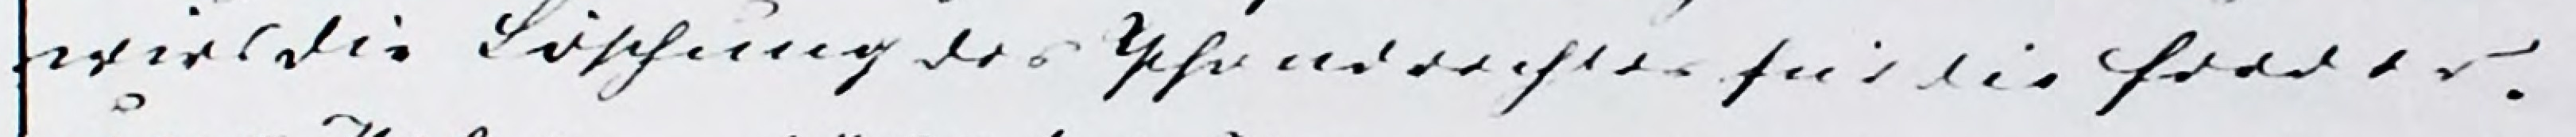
wird die Löschung des Pfandrechtes für die Forder„
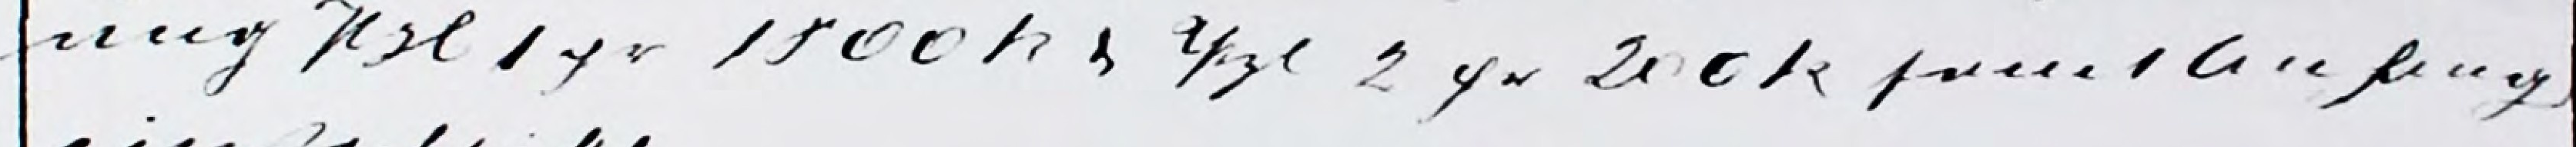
ung Pzl 1 pr 1800 k & Pzl 2 pr 200 k samt Anhang
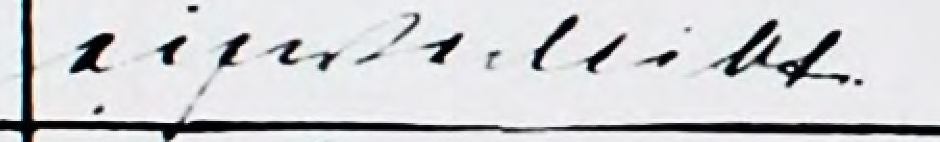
einverleibt.
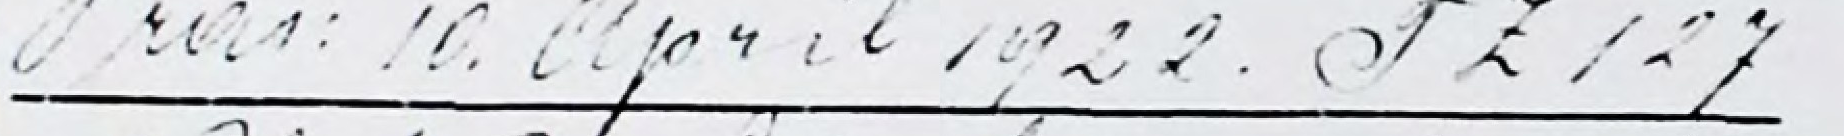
Präs: 10. April 1922. T Z 127
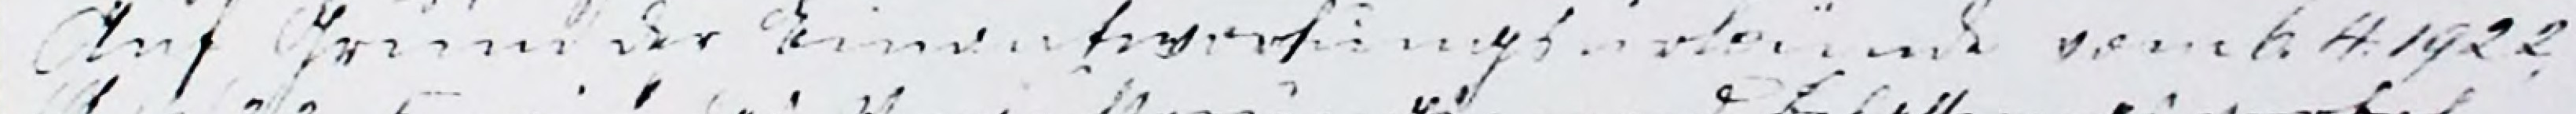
Auf Grund der Einantwortungsurkunde vo 6. 4. 1922
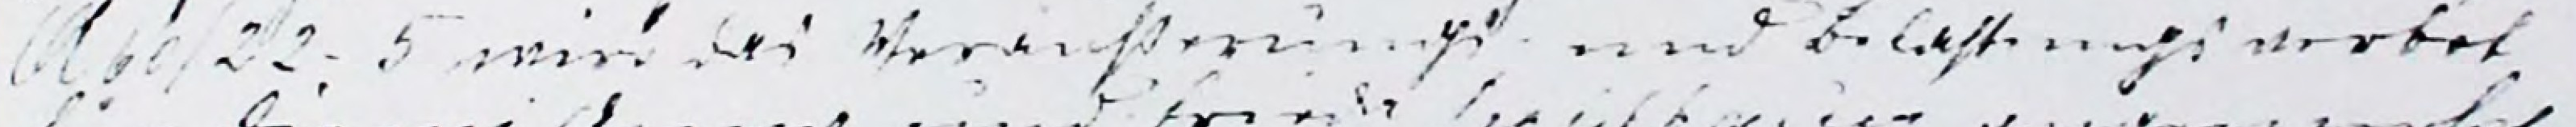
A 60/22-5 wird des Veräußerungs- und Belastungsverbot
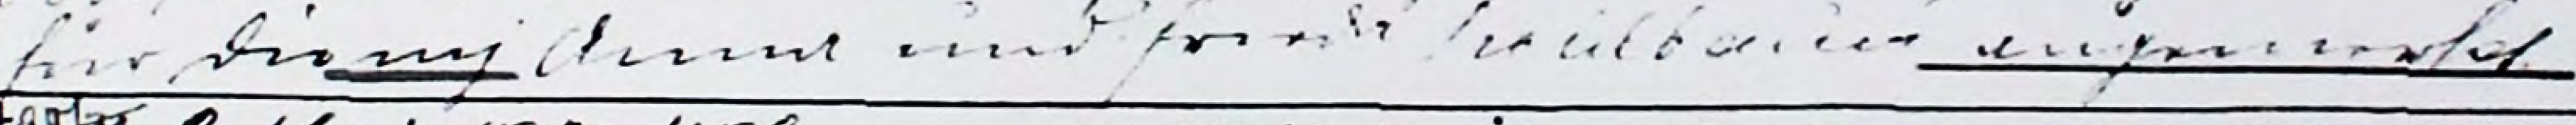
für die mj Anna und Frieda Pichlbauer angemerkt.
